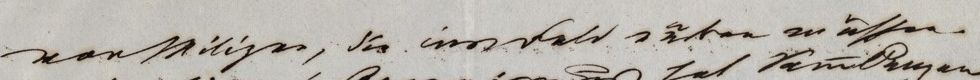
von Milizen, die ins Feld rücken müssen.
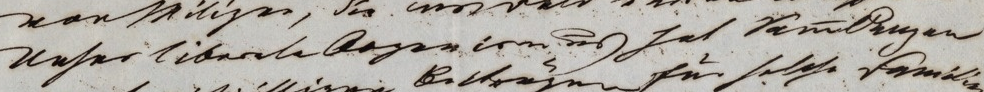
Unser liberale Organismus hat Sammlungen
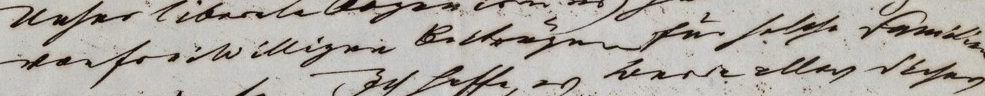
von freiwilligen Beiträgen für solche Familien
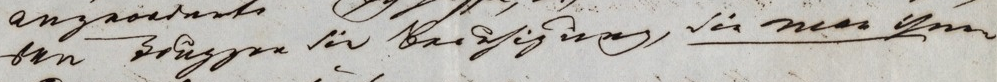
den Truppen die Beruhigung, die man ihnen
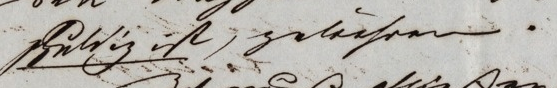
schuldig ist, gewähren.
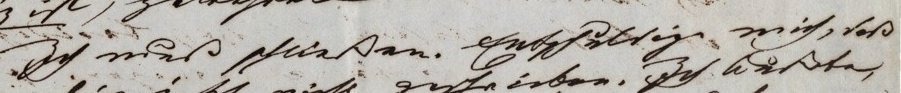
Ich muß schließen. Entschuldige mich, daß
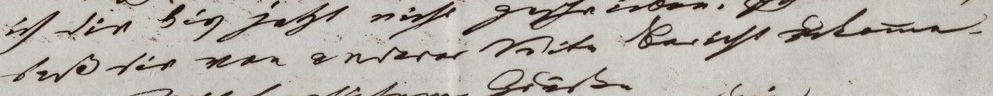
daß Dir von anderer Seite Bericht zukomme.
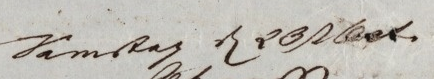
Samstag den 23st Oct.
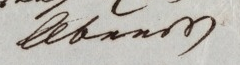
Abends.
